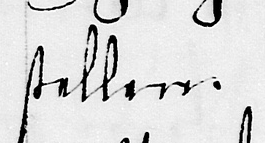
stellen.
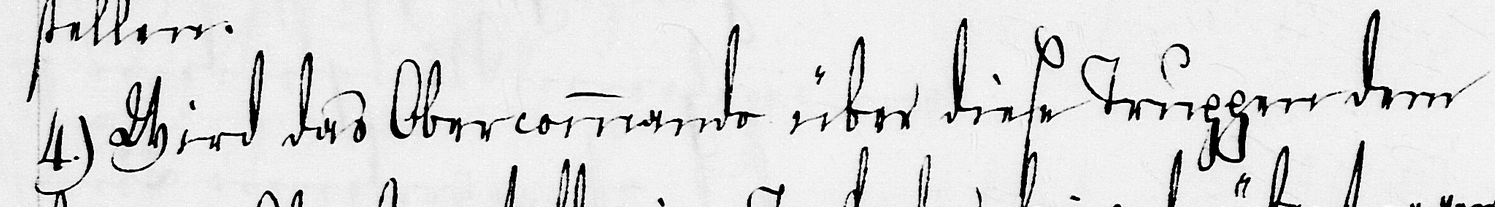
4.) Wird das Obercommando über diese Truppen dem
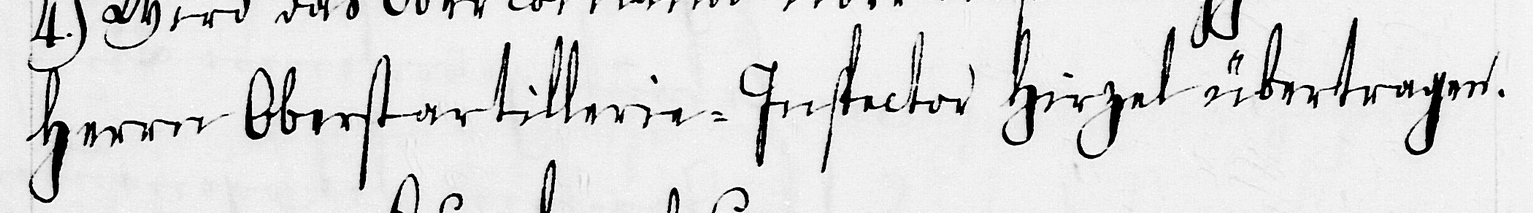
Herrn Oberstartillerie-Inspector Hirzel übertragen.
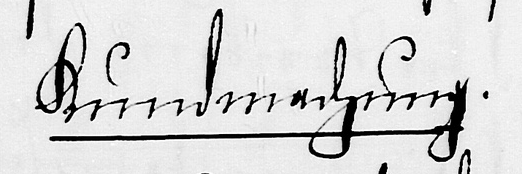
Kundmachung.
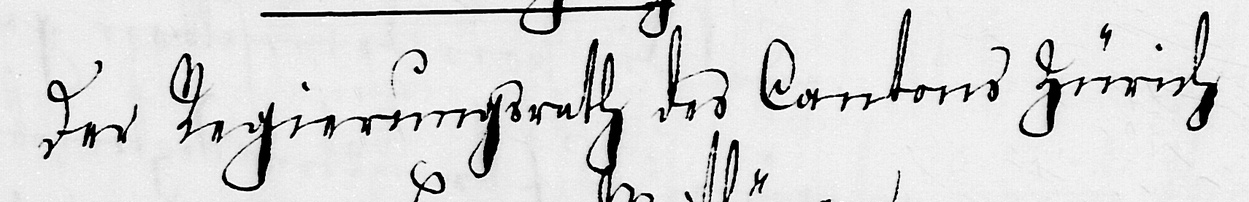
Der Regierungsrath des Cantons Zürich
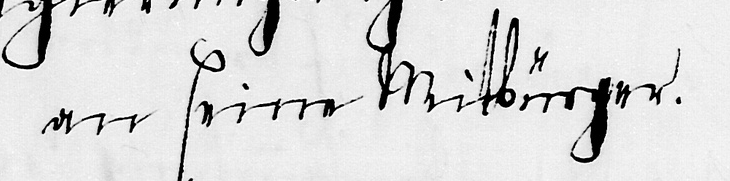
an seine Mitbürger
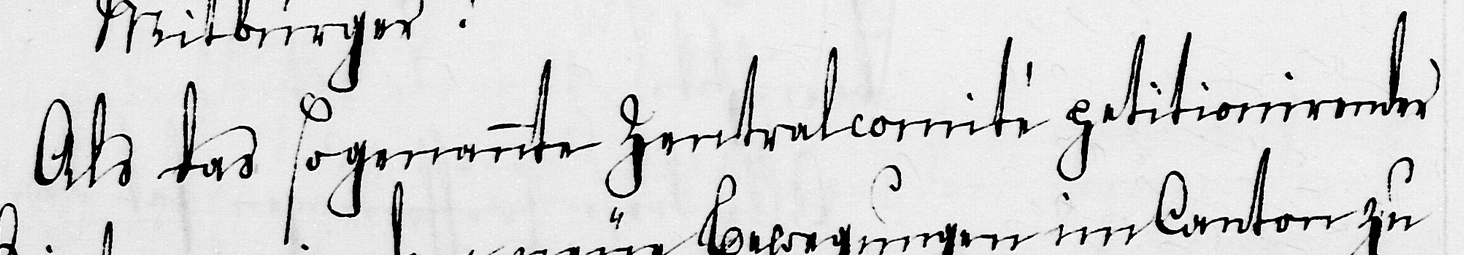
Als das sogenannte Zentralcomité petitionirender
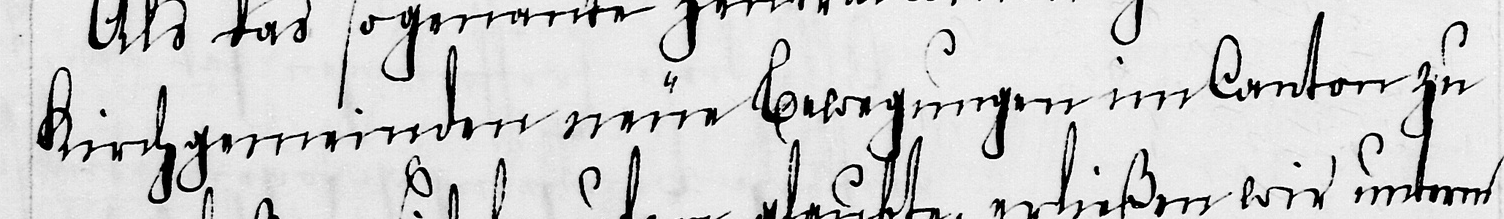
Kirchgemeinden neue Bewegungen im Canton zu
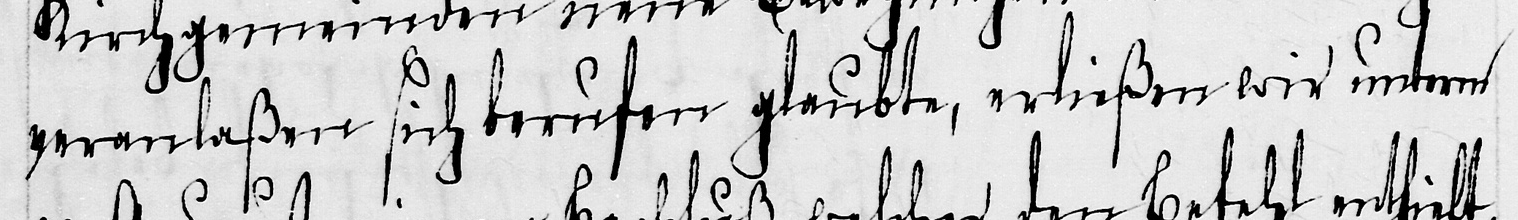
veranlaßen sich berufen glaubte, erließen wir unterm
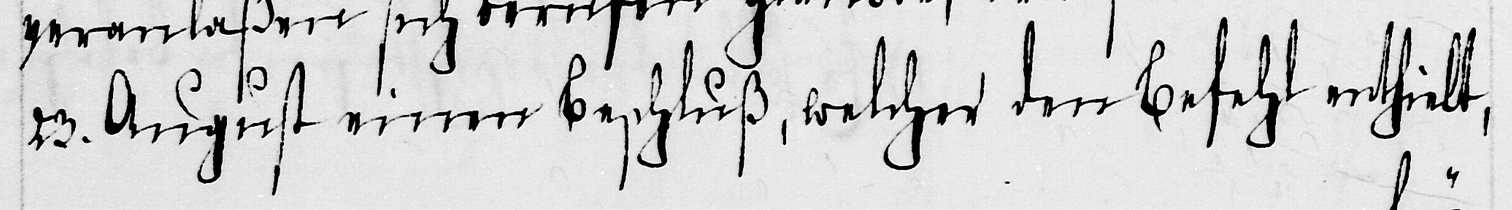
23. August einen Beschluß, welcher den Befehl enthielt,
